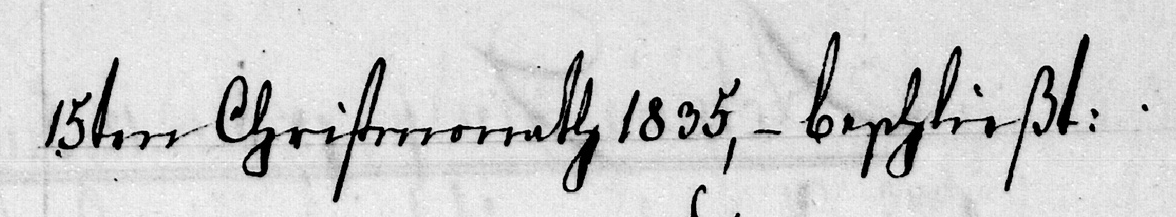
15ten Christmonath 1835, – beschließt:
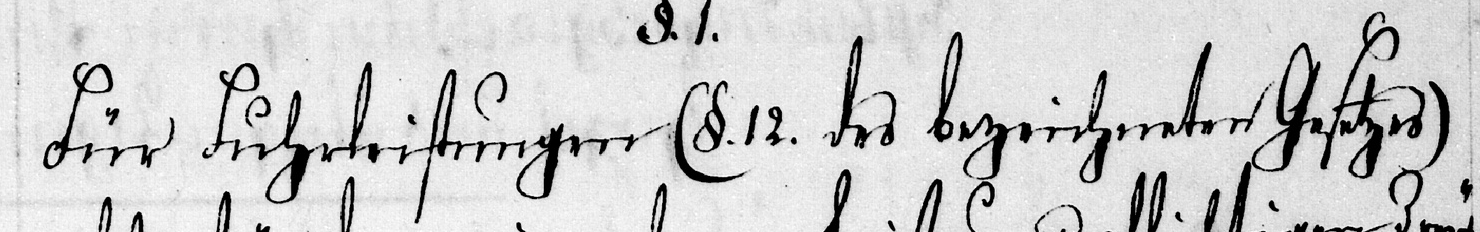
Für Fuhrleistungen (§. 12. des bezeichneten Gesetze¬
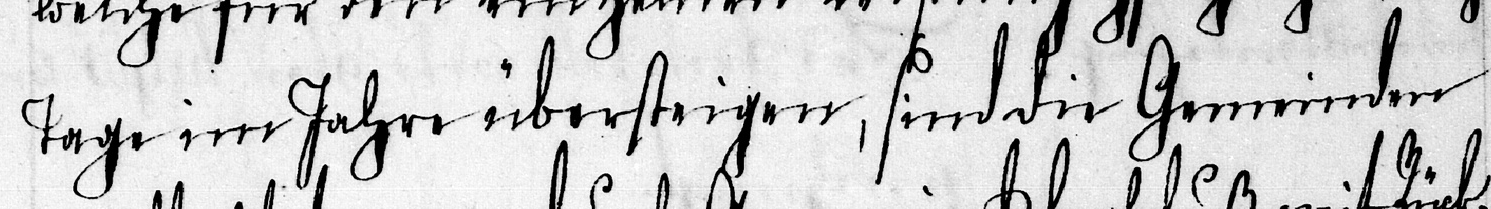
Tage im Jahre übersteigen, sind die Gemeinden
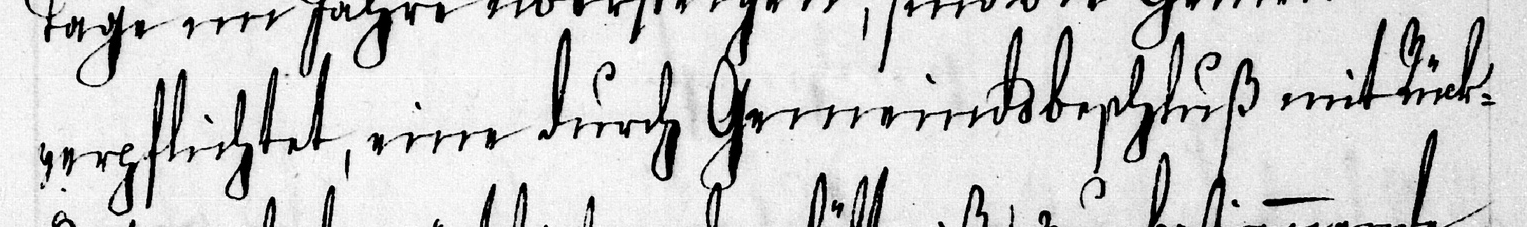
verpflichtet, eine durch Gemeindsbeschluß mit Rück¬
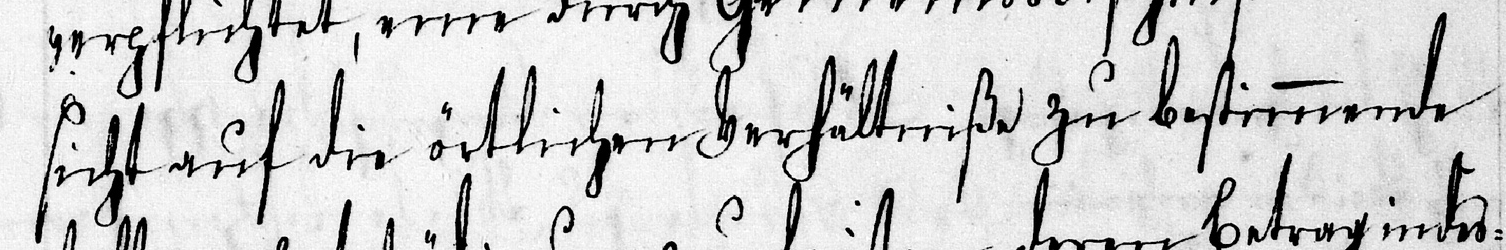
sicht auf die örtlichen Verhältniße zu bestimmende
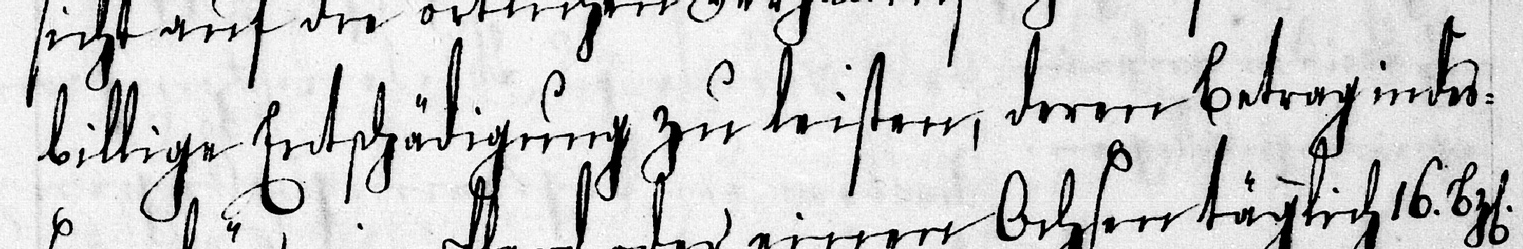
billige Entschädigung zu leisten, deren Betrag inde¬
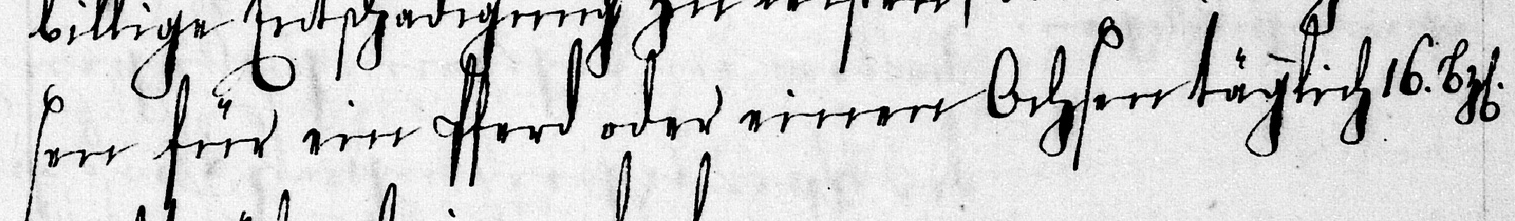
ßen für ein Pferd oder einen Ochsen täglich 16.
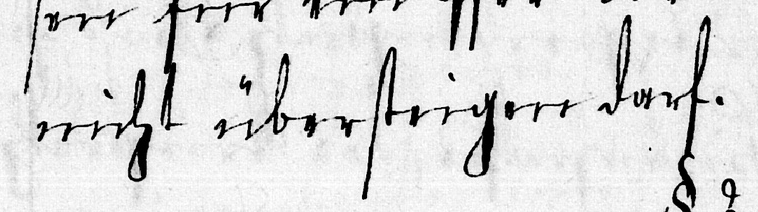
nicht übersteigen darf.
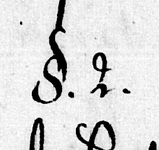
§. 2.
